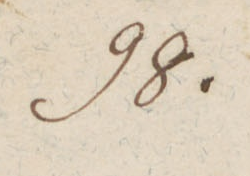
98.
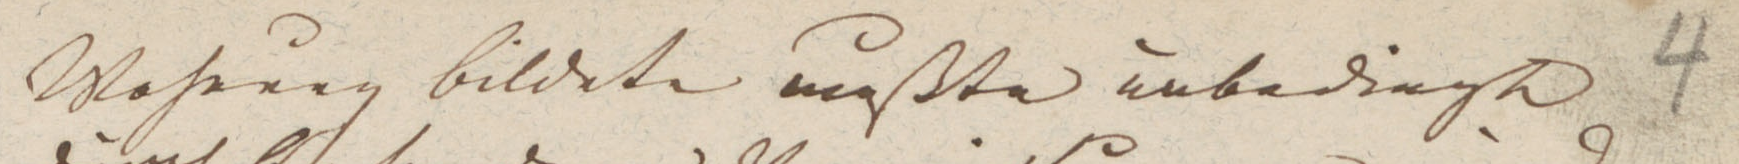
Wohnung bildete musste unbedingt
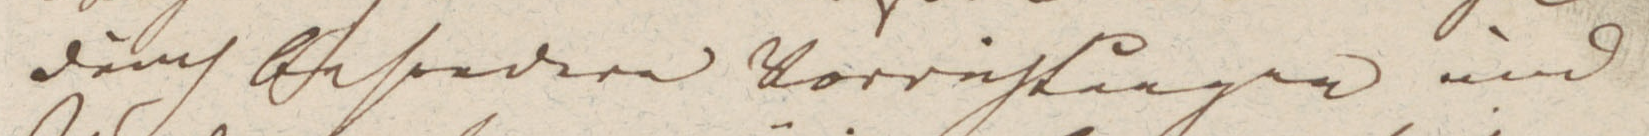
durch besondere Vorrichtungen und
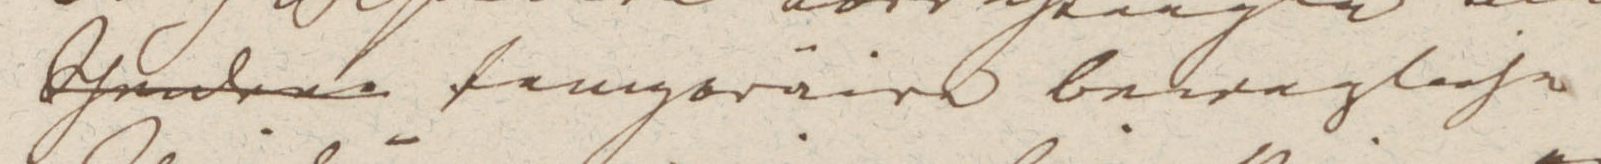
Scheid temporäire bewegliche
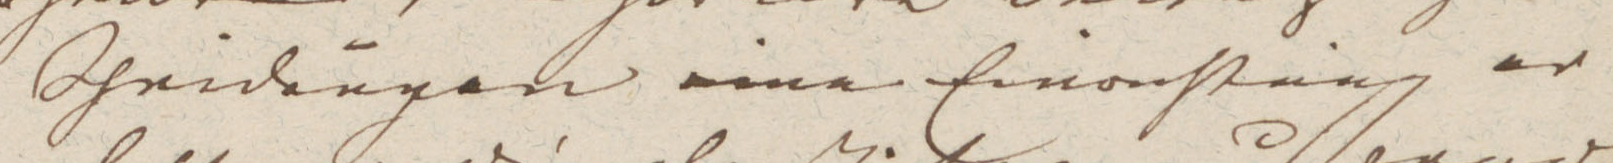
Scheidungen eine Einrichtung er-
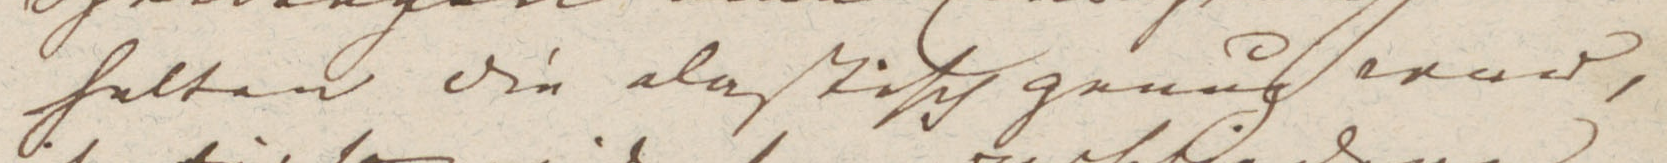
halten die elastisch genug war,
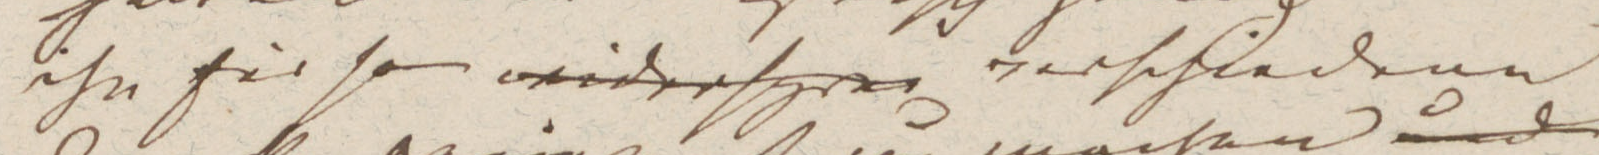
ihn für so wiedersprec verschiedene
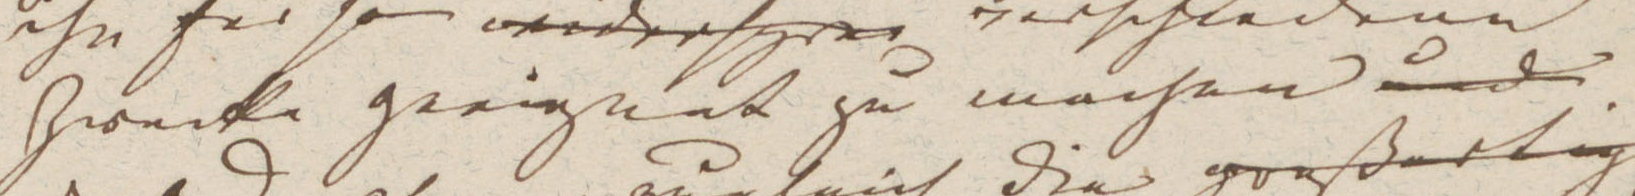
Zwecke geeignet zu machen und
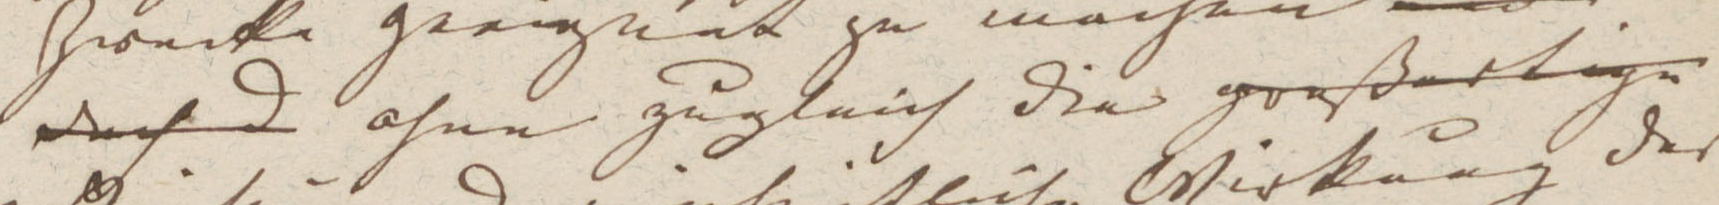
doch d ohne zugleich die grossartige
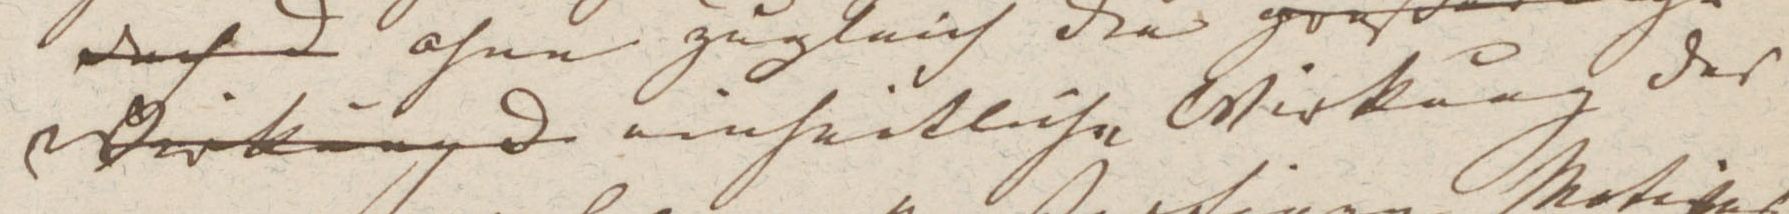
Wirkung d einheitliche Wirkung des
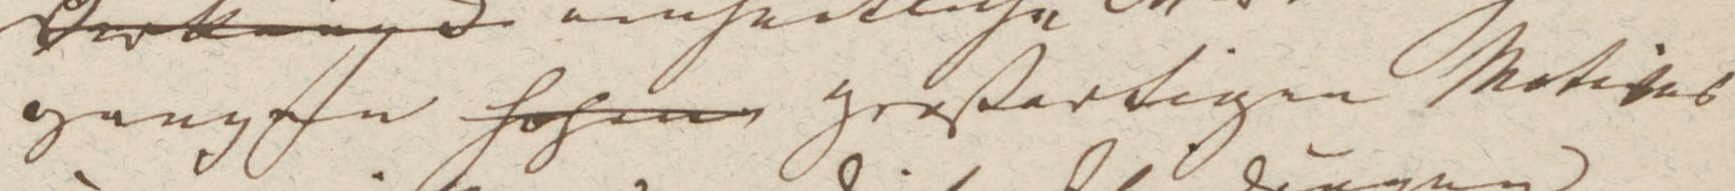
ganzen hohen grossartigen Motives
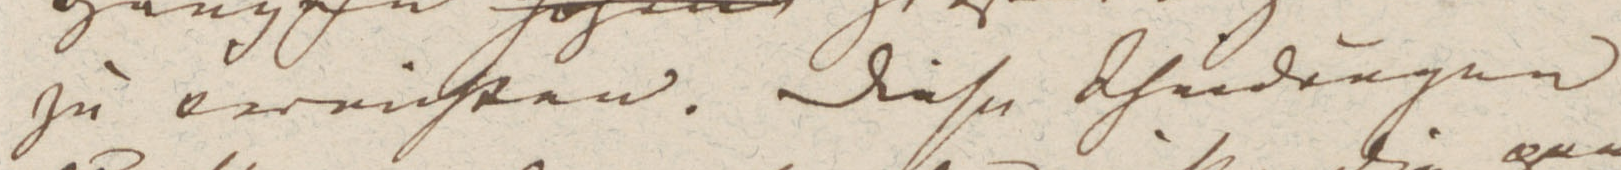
zu vernichten. Diese Scheidungen
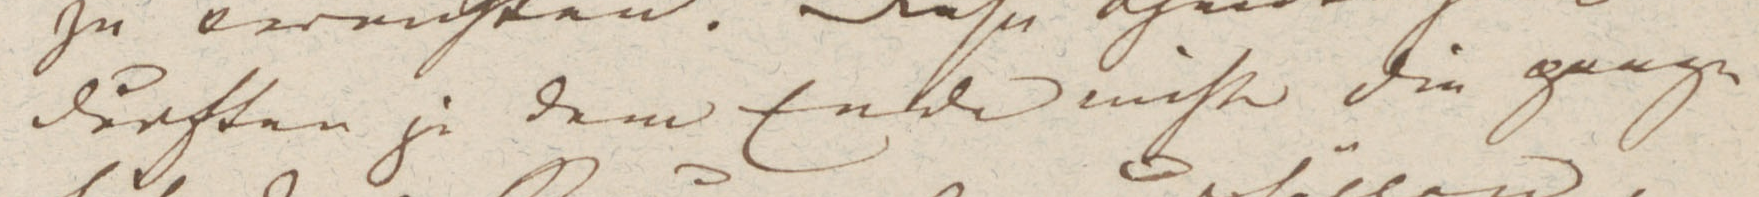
durften zu dem Ende nicht die ganze
